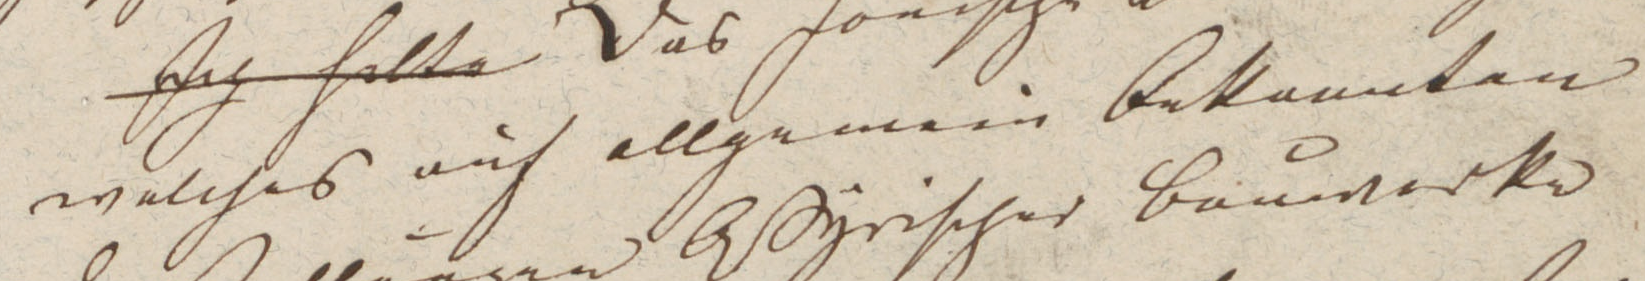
welches auf allgemein bekannten
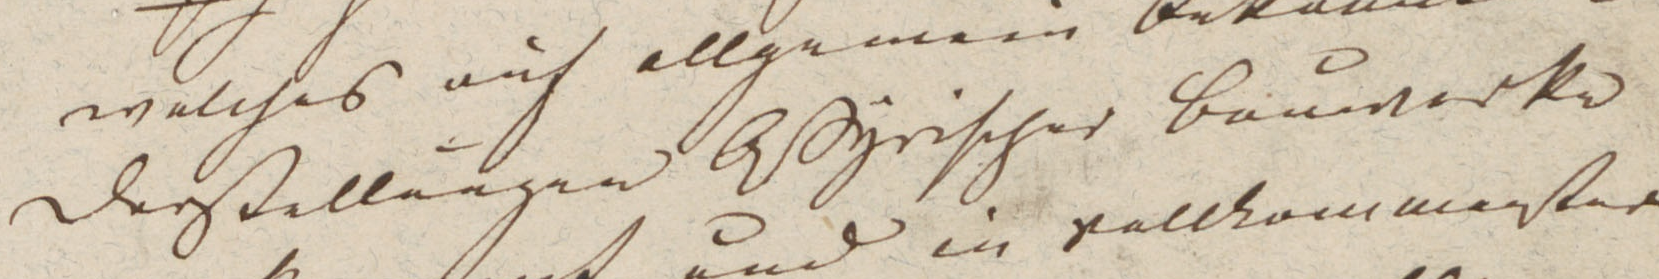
Darstellungen Assyrischer Bauwerke
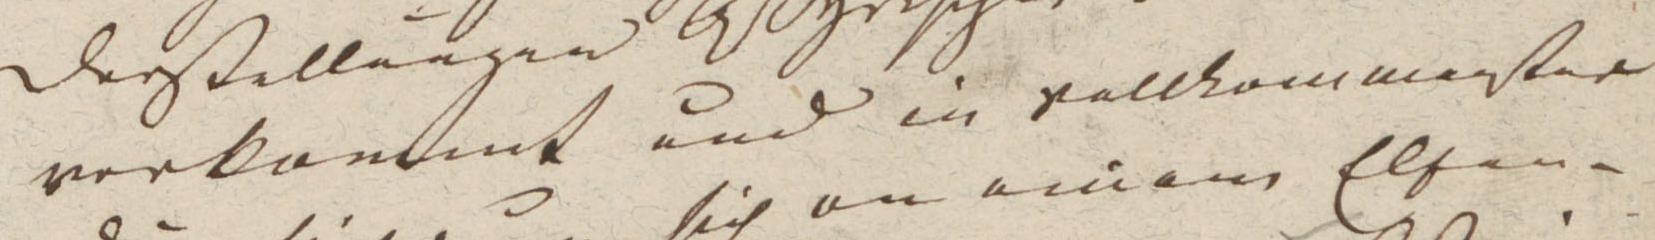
vorkommt und in vollkommenster
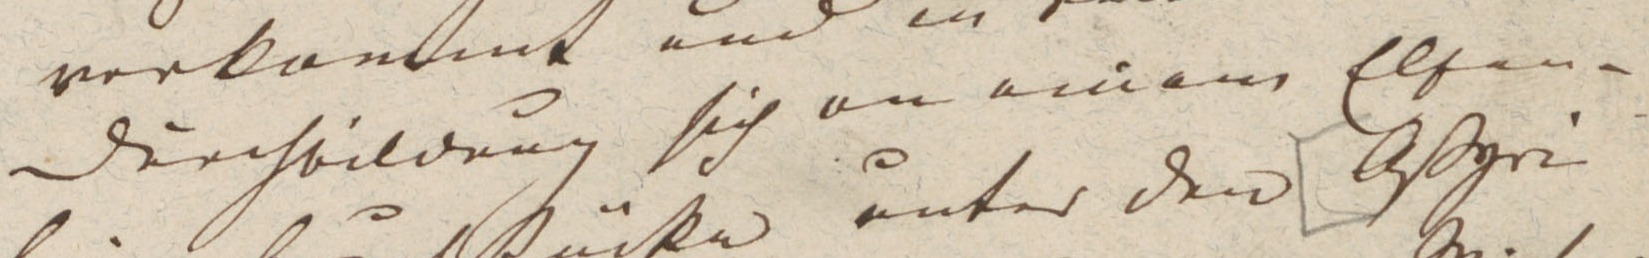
Durchbildung sich an einem Elfen-
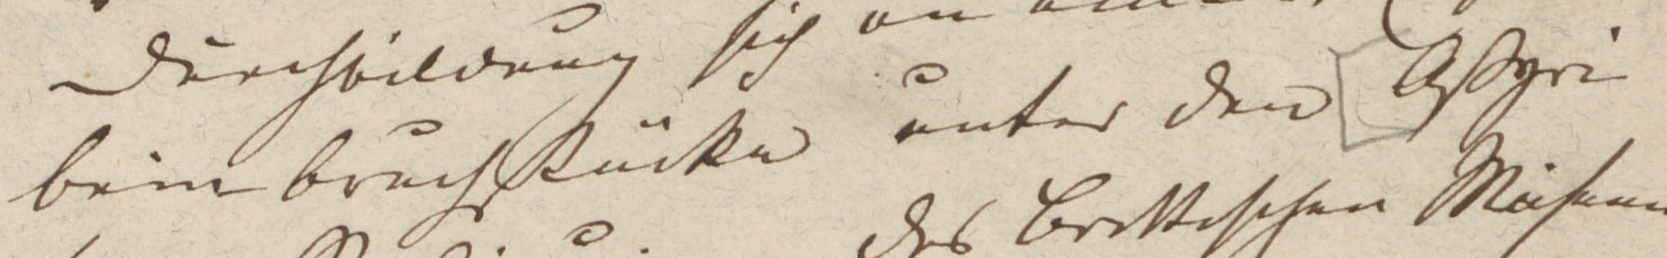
beinbruchstücke unter den % Assyri
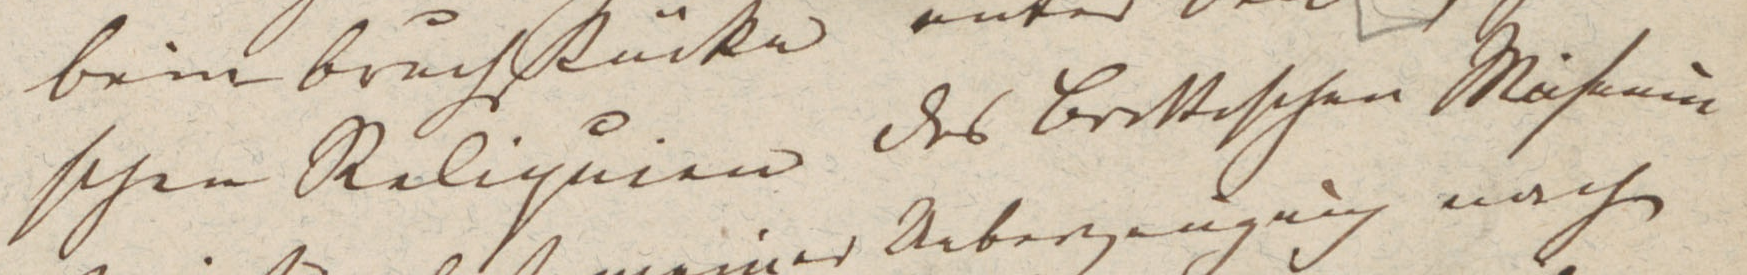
schen Reliquien des Brittischen Museum
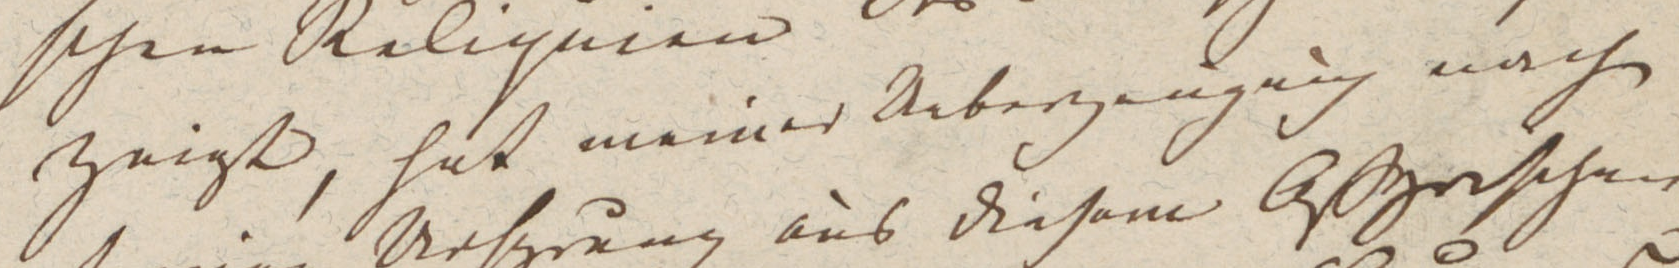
zeigt, hat meiner Ueberzeugung nach
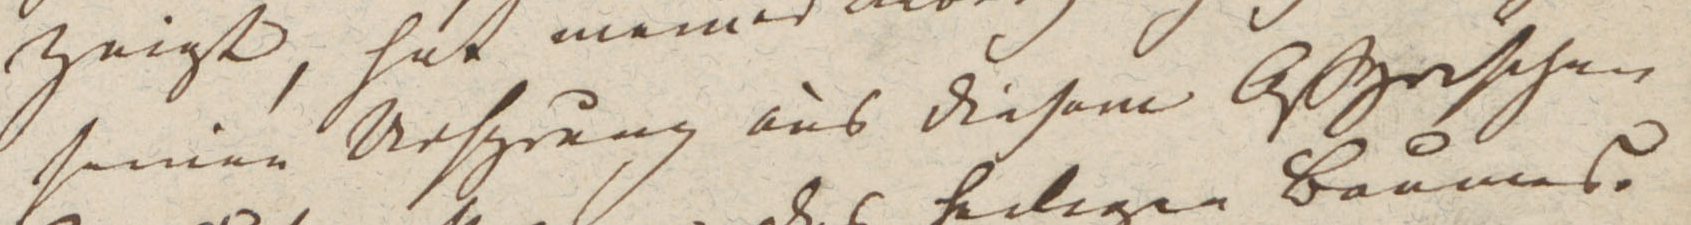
seinen Ursprung aus diesem Assyrischen
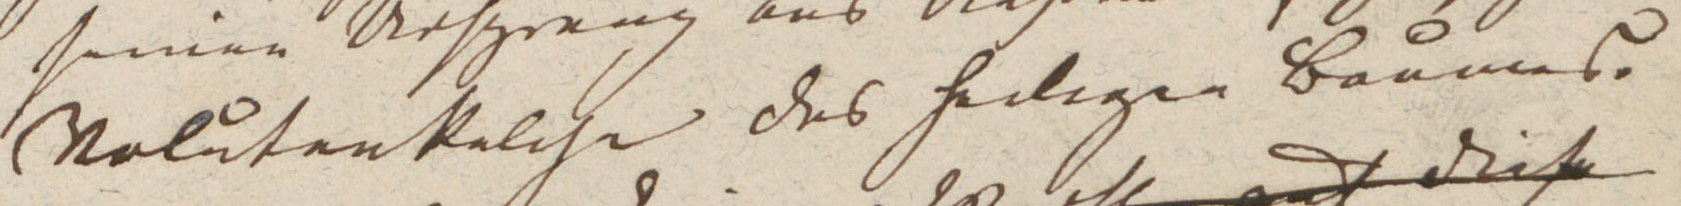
Volutenkelche des heiligen Baumes.
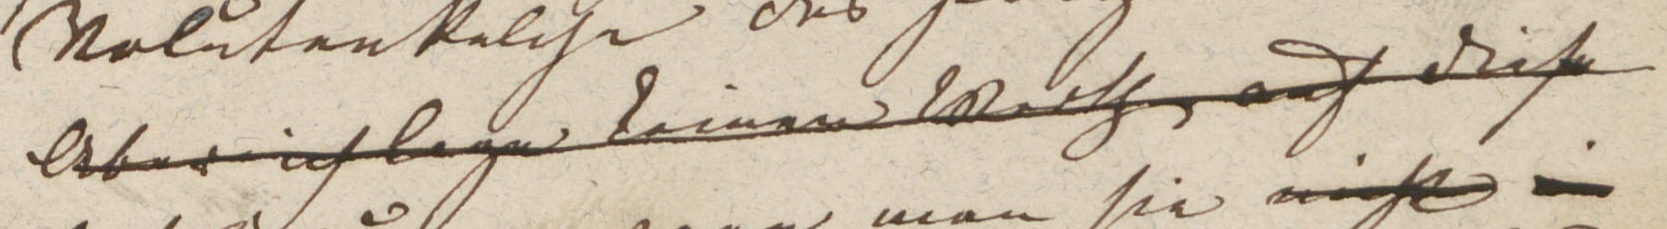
Aber ich lege keinen Werth auf diese
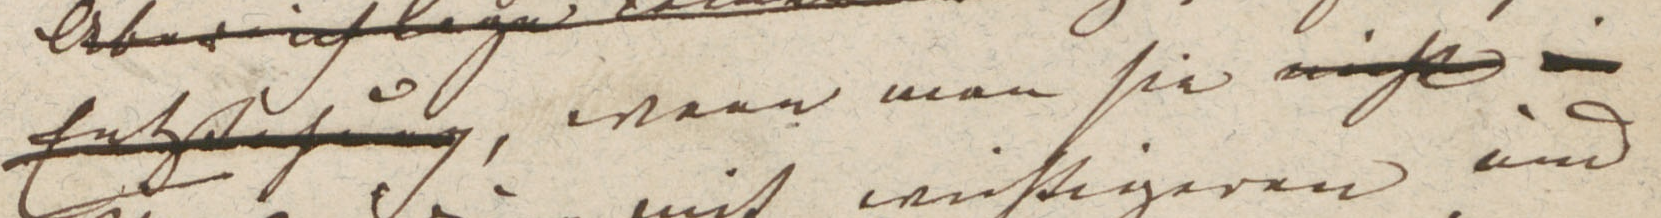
Entstehung, wenn man sie nicht in
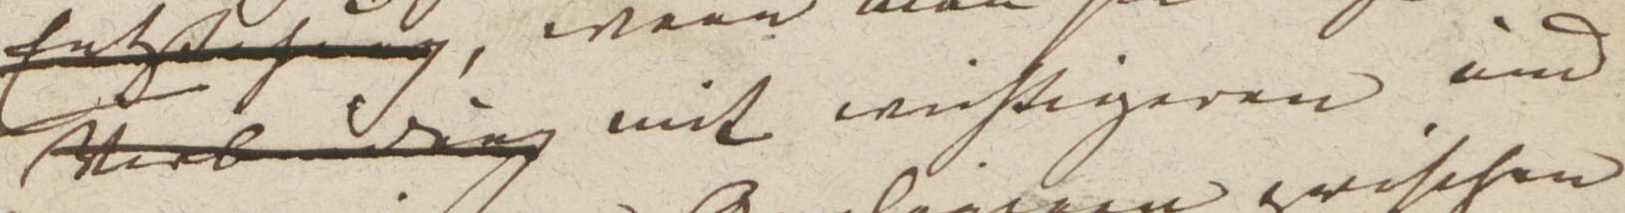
Verbindung mit wichtigeren und
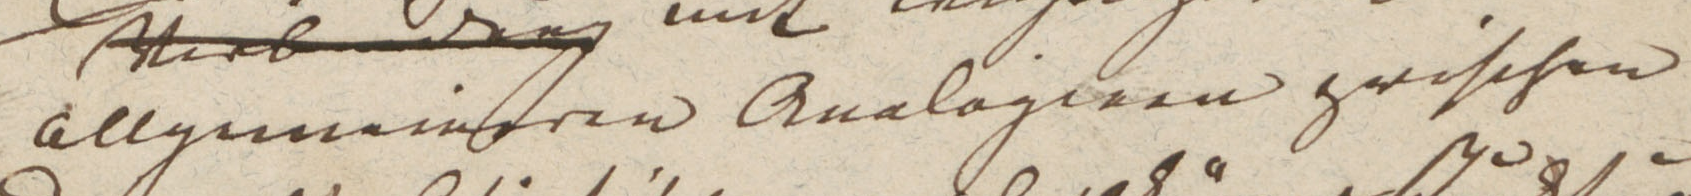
allgememeineren Analogieen zwischen
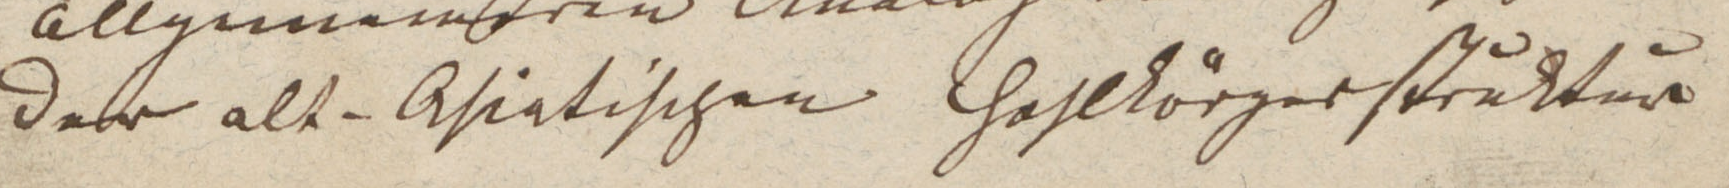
der alt-Asiatischen Hohlkörperstruktur
